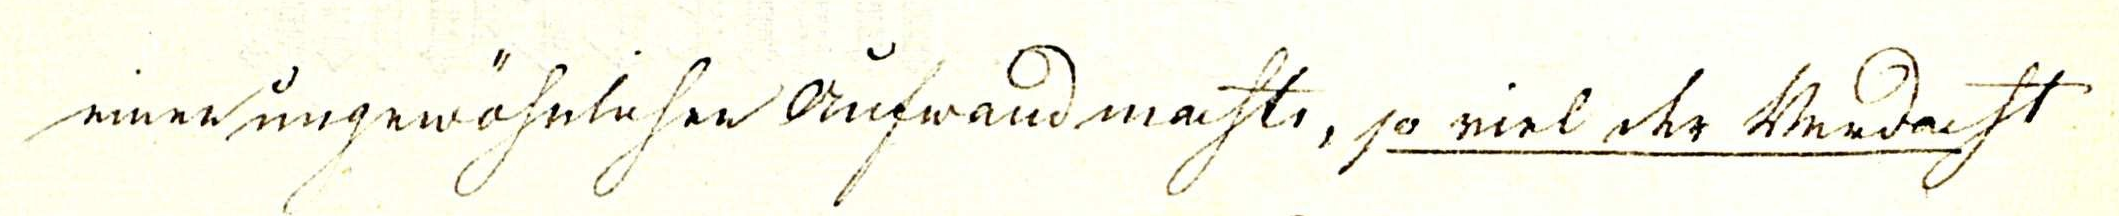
einen ungewöhnlichen Aufwand machte, so viel der Verdacht
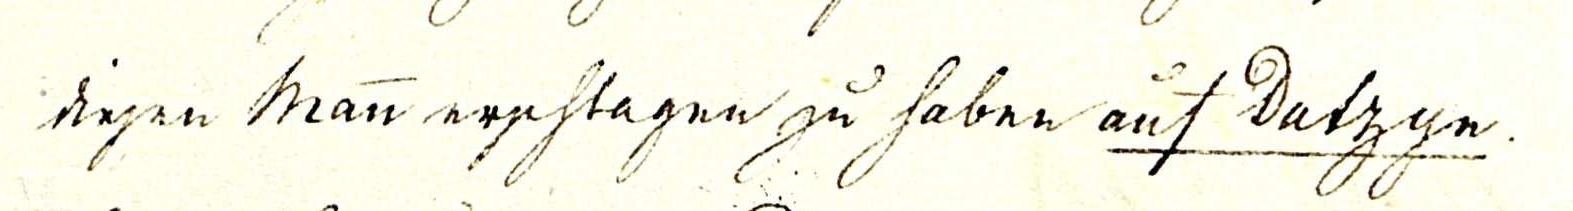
diesen Mann erschlagen zu haben auf Dutzyn.
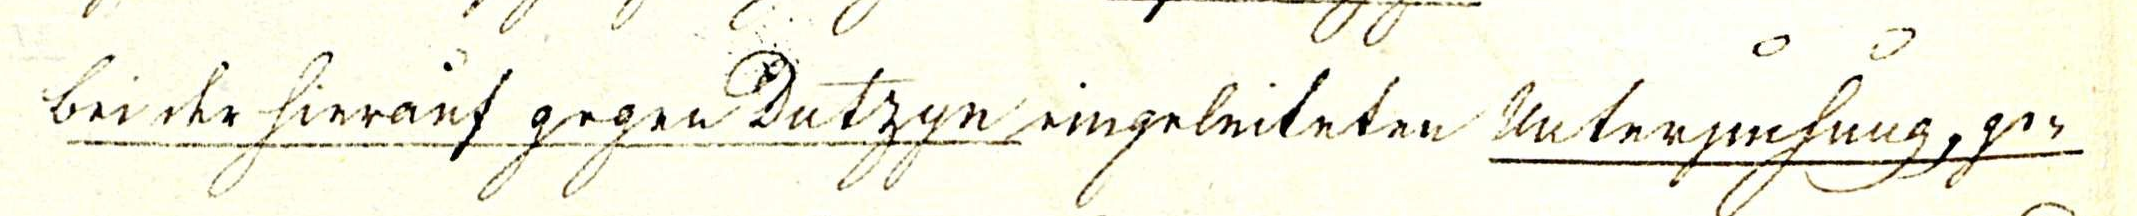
Bei der hierauf gegen Dutzyn eingeleiteten Untersuchung, ge¬
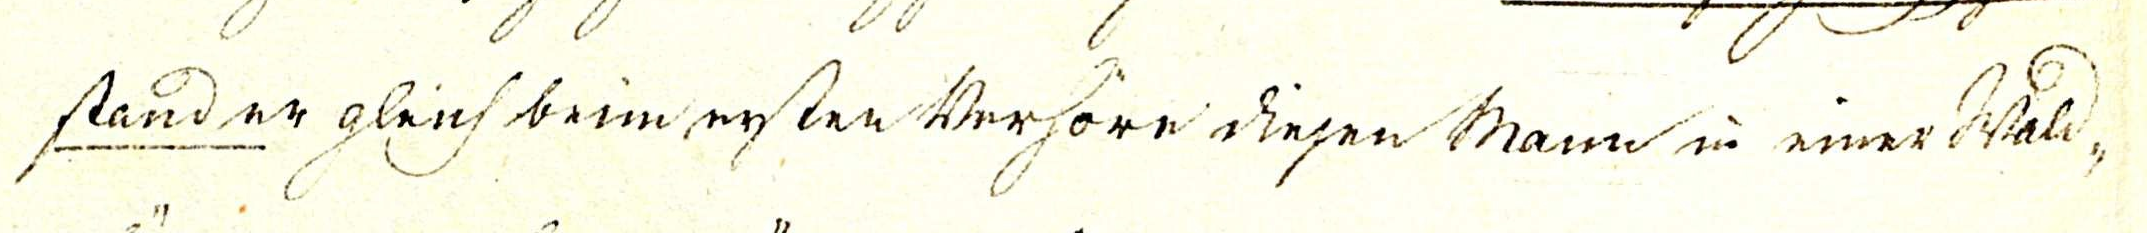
stand er gleich beim ersten Verhöre diesen Mann in einer Wald¬
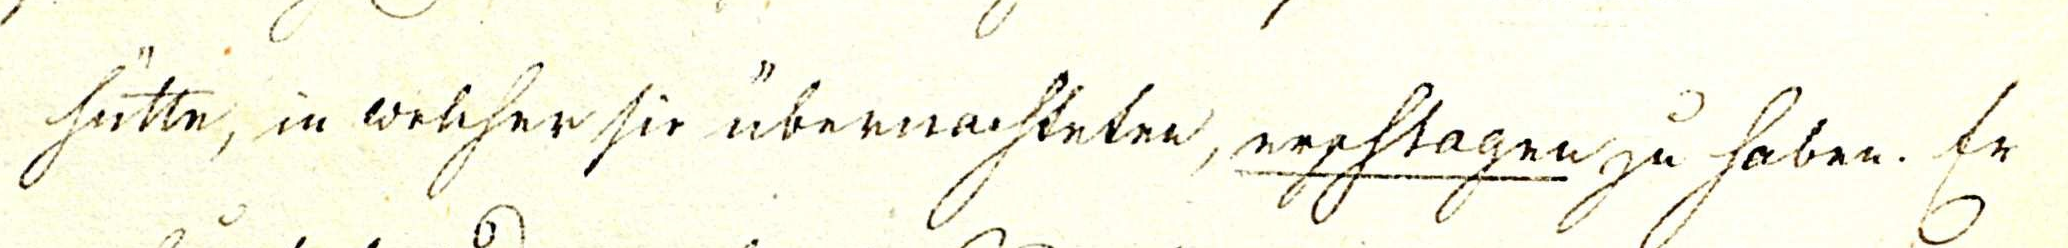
hütte, in welcher sie übernachteten, ershlagen zu haben. Er
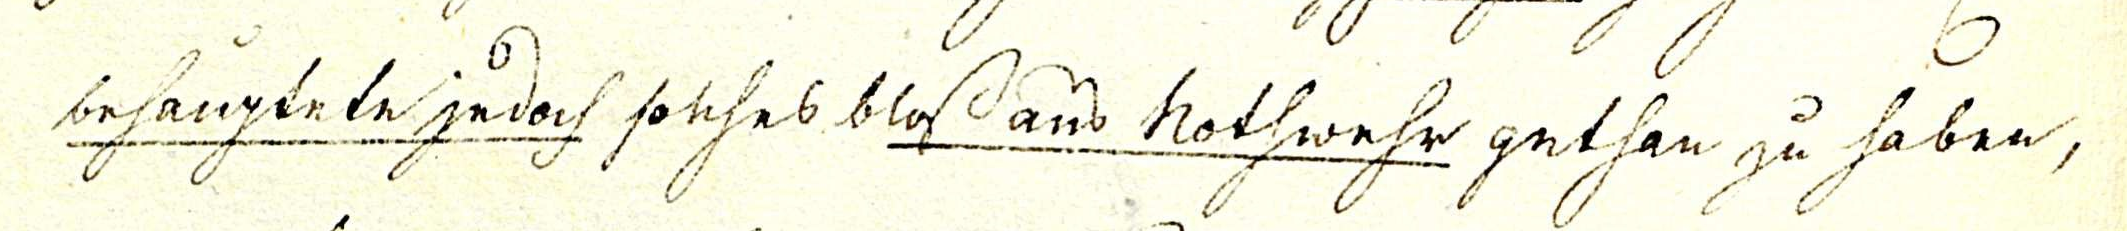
behauptete jedoch solches bloß aus Nothwehr gethan zu haben,
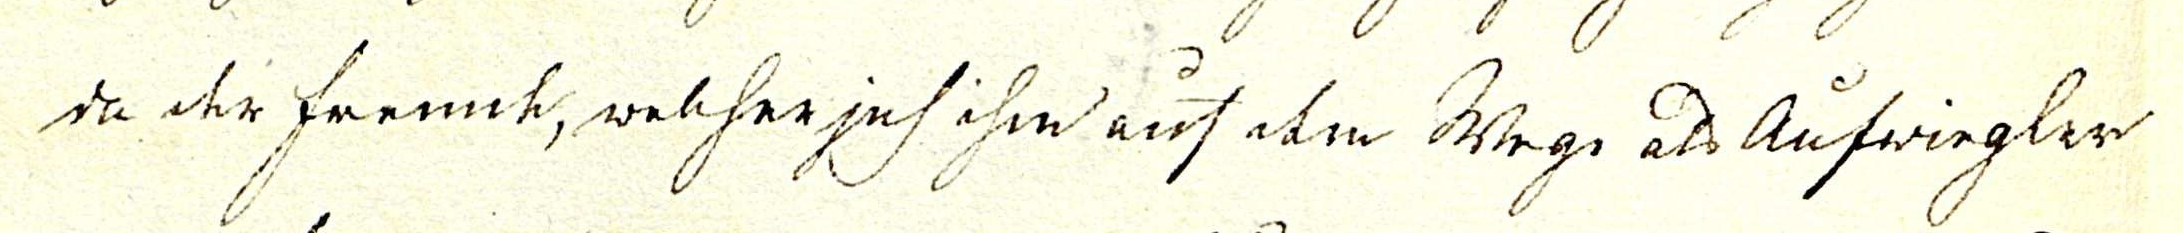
da der fremde, welcher jeh ihm auf dem Wege als Aufwiegler
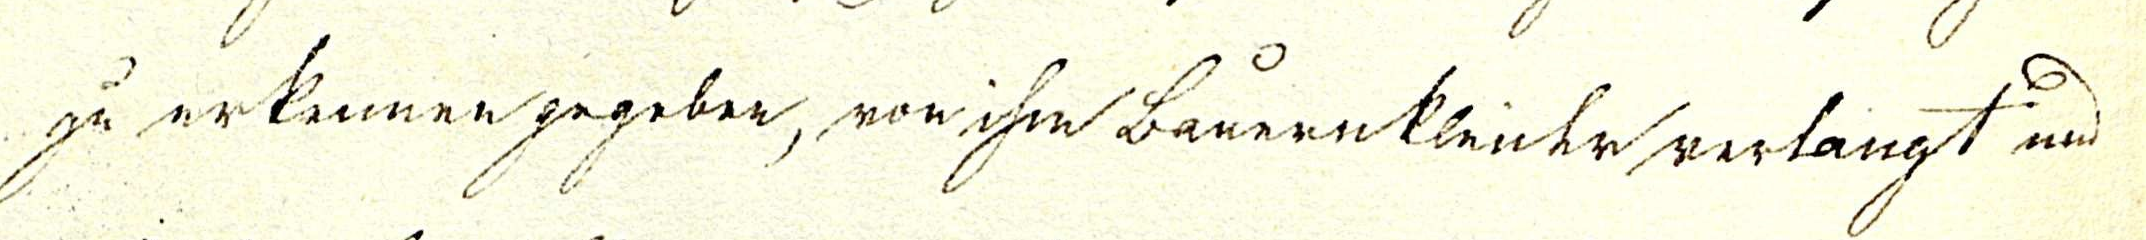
zu erkennen gegeben, von ihm Bauernkleider verlangt und
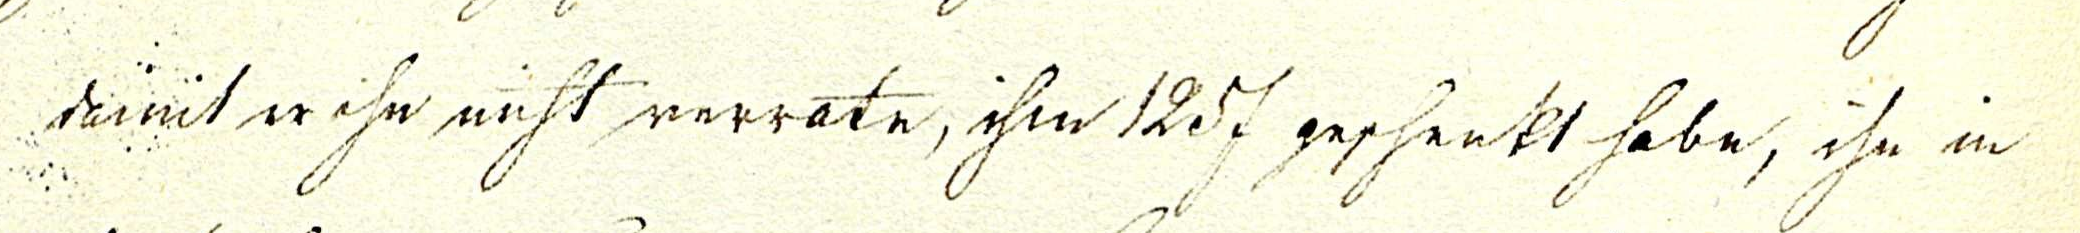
damit er ihn nicht verrate, ihm 125f geshenkt habe, ihn in
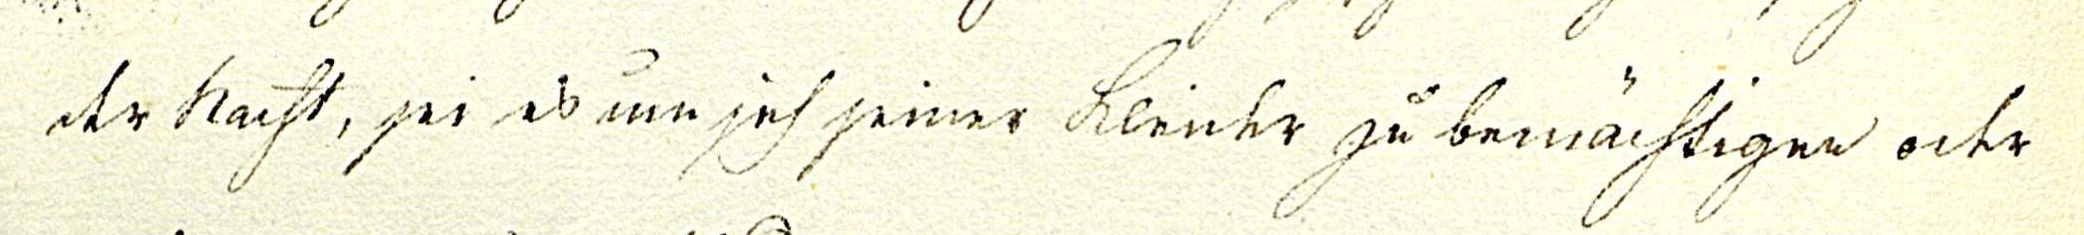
der Nacht, sei es um sich seiner Kleider zu bemächtigen oder
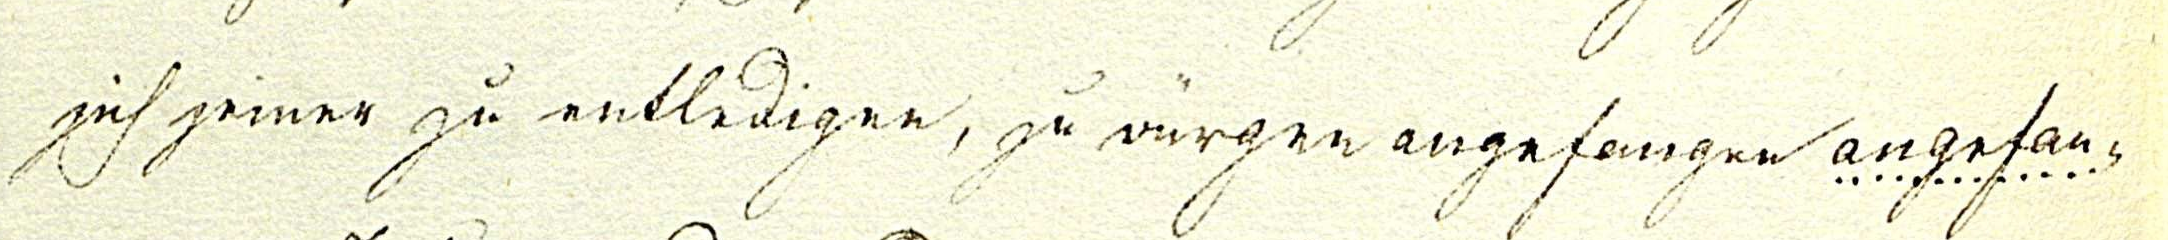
sich seiner zu entledigen, zu ärgen angefangen angefan¬
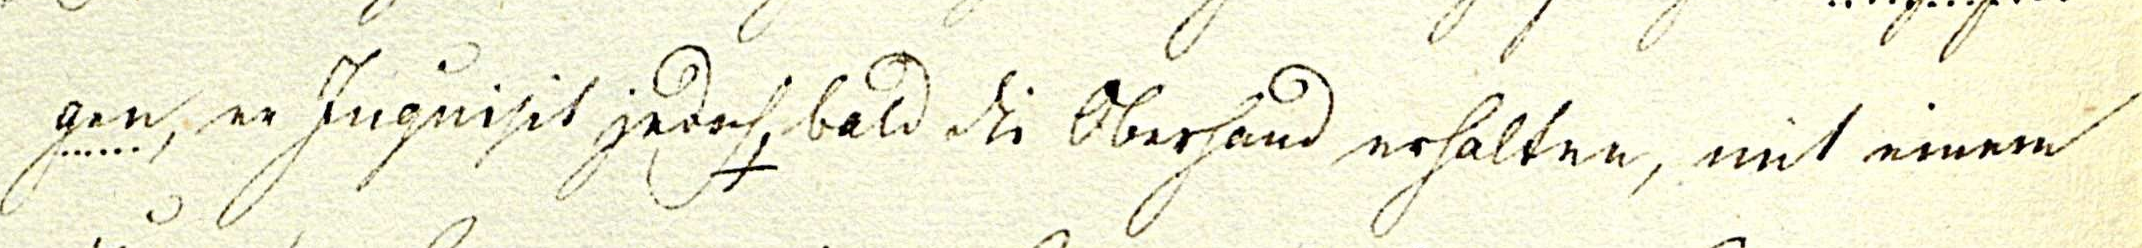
gen, er Inquisit jedoch bald die Oberhand erhalten, mit einem
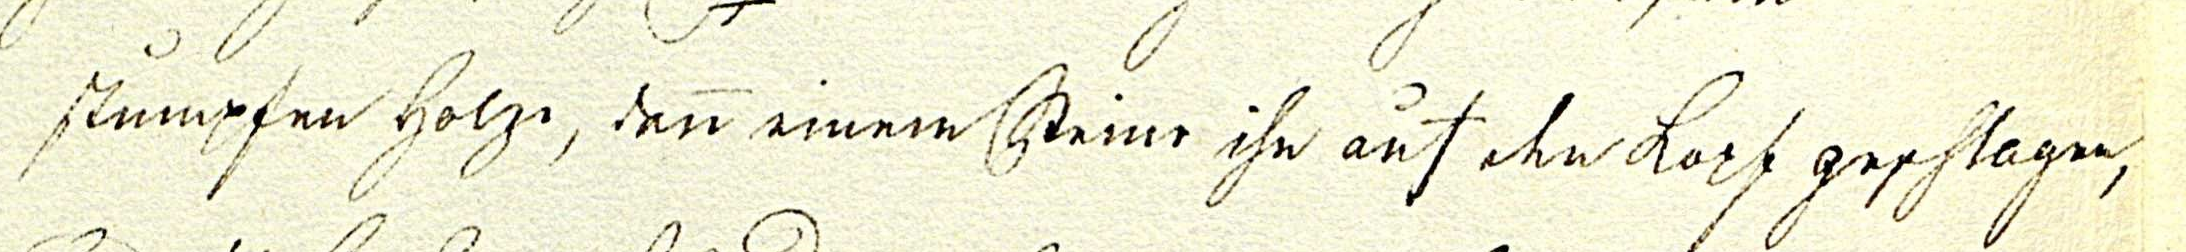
stumpfen Holze, denn einem Steine ihn auf den Kopf geshlagen,
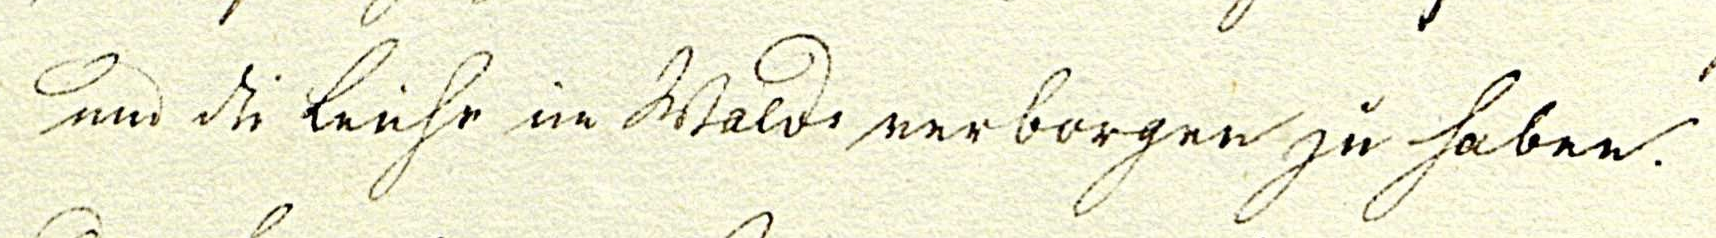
und die Leiche im Walde verborgen zu haben.
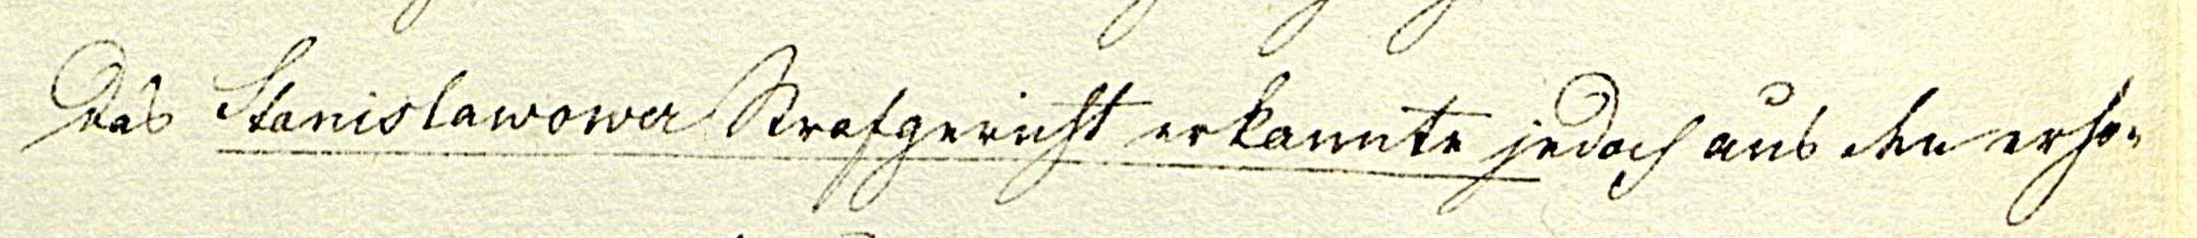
Das Stanislawower Strafgericht erkannte jedoch aus den erho¬
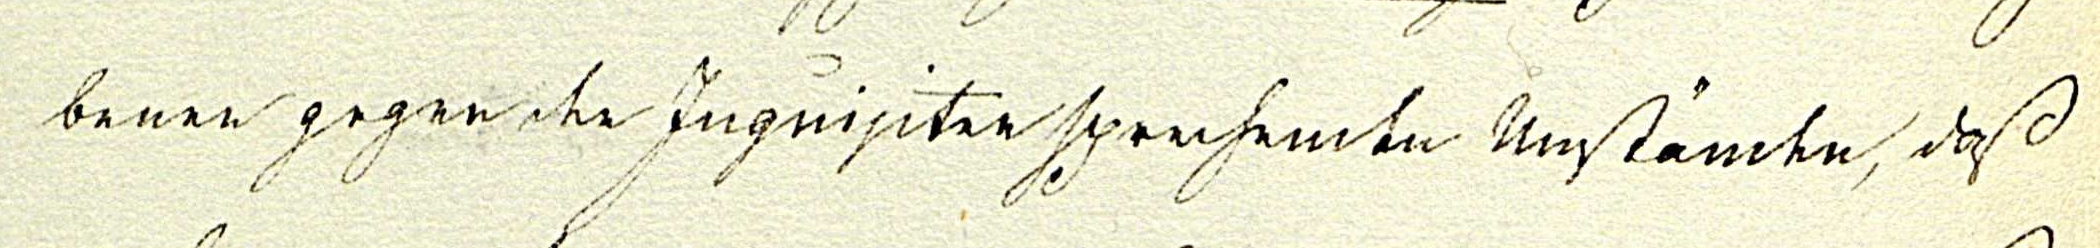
benen gegen den Inquisiten sprechende Umstände, daß
